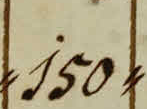150
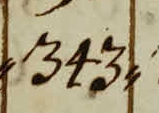343
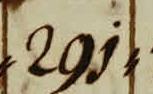291
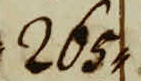265
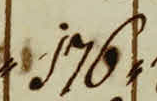176
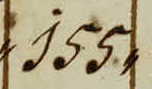155
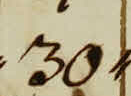30
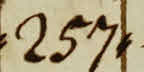257
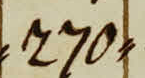270
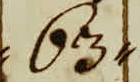63
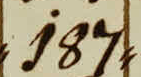187
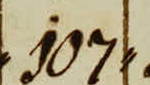107
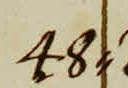48
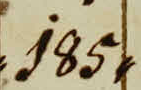185
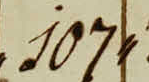107
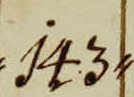143
